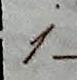1
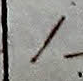1
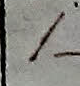1
